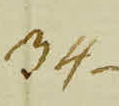34
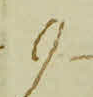9
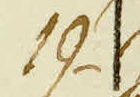19 -
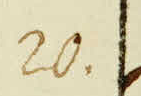20.
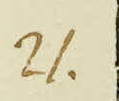21-
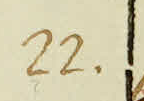22.
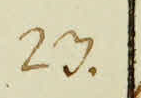23.
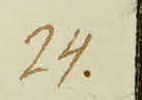24.
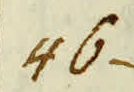46
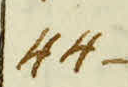44
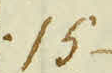15
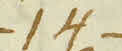14
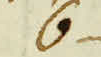6
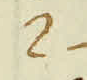2
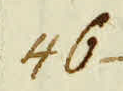46
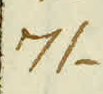71
